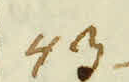43
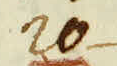20
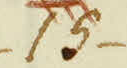15
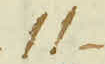11
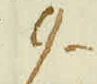9
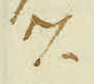7
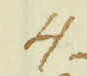4
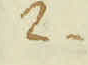2
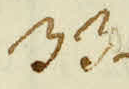33
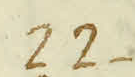22
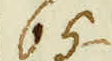65
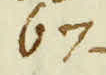67
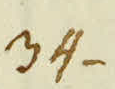34
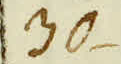30
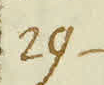29
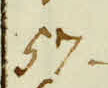57
